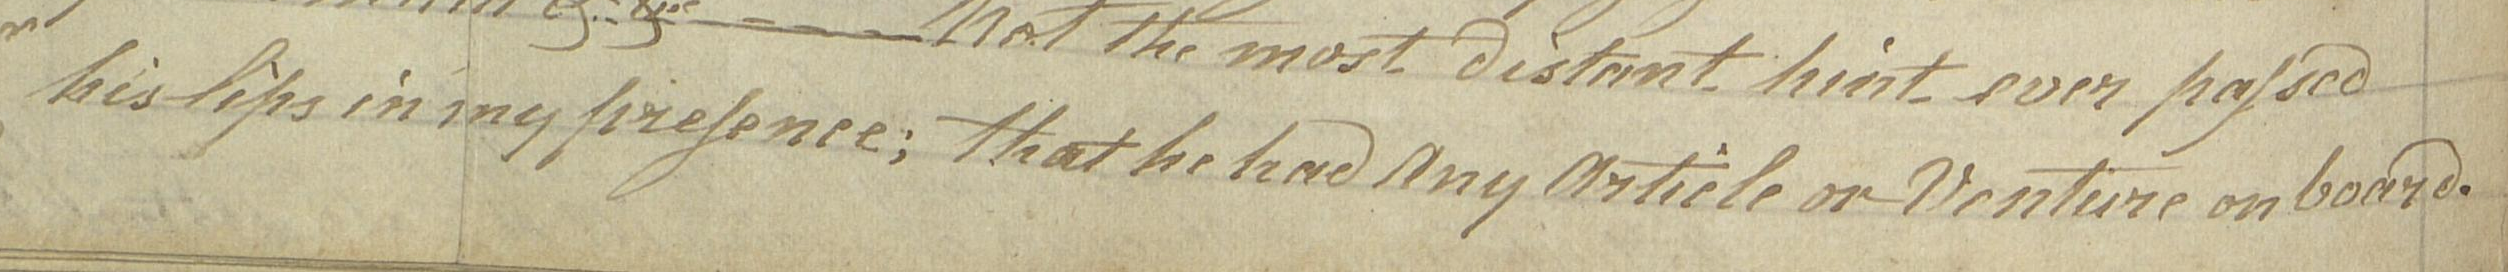his lips in my presence; that he had my Article or Venture on board.
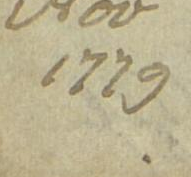1779
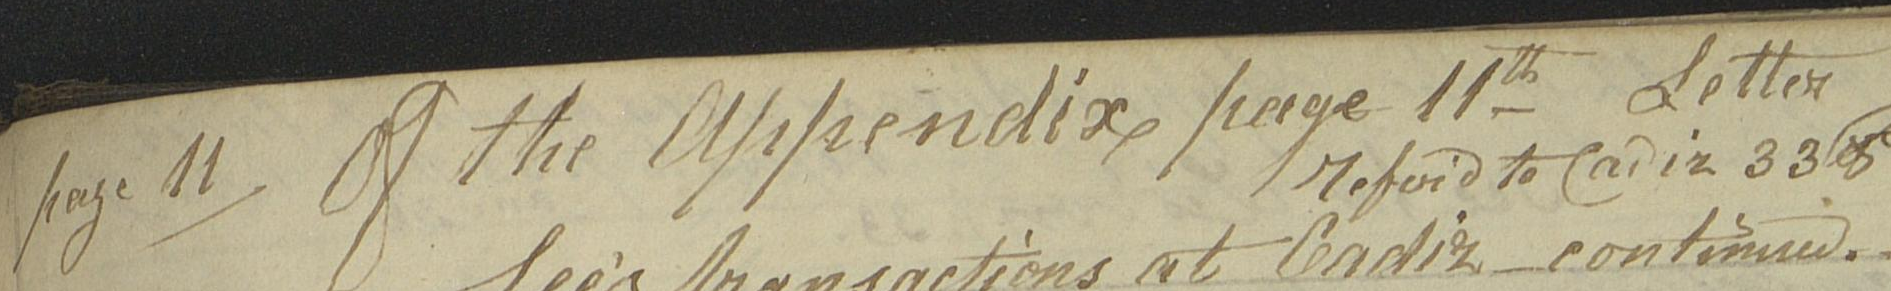page 11. of the Appendix page 11^th Letter J
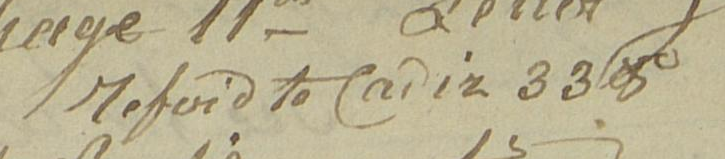refer'd to Cadiz 338
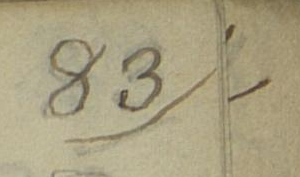83
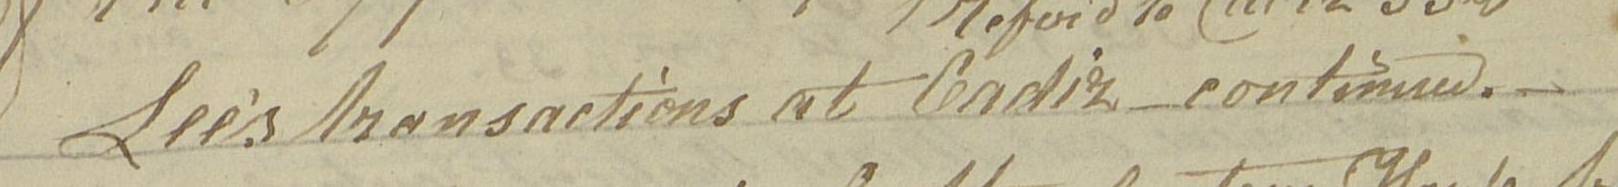Lee's transactions at Cadiz continued.
